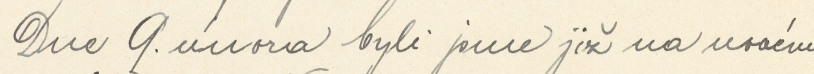Dne 9. února byli jsme již na novém
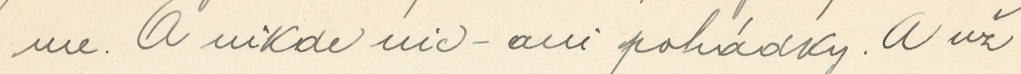me. A nikde nic - ani pohádky. A už
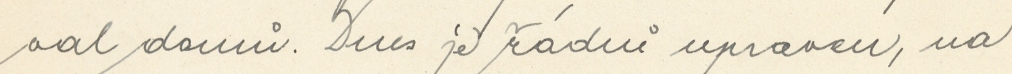val domů. Dnes je řádně upraven, na
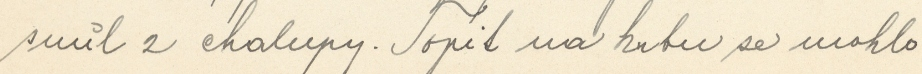směl z chalupy. Topit na krbu se mohlo
